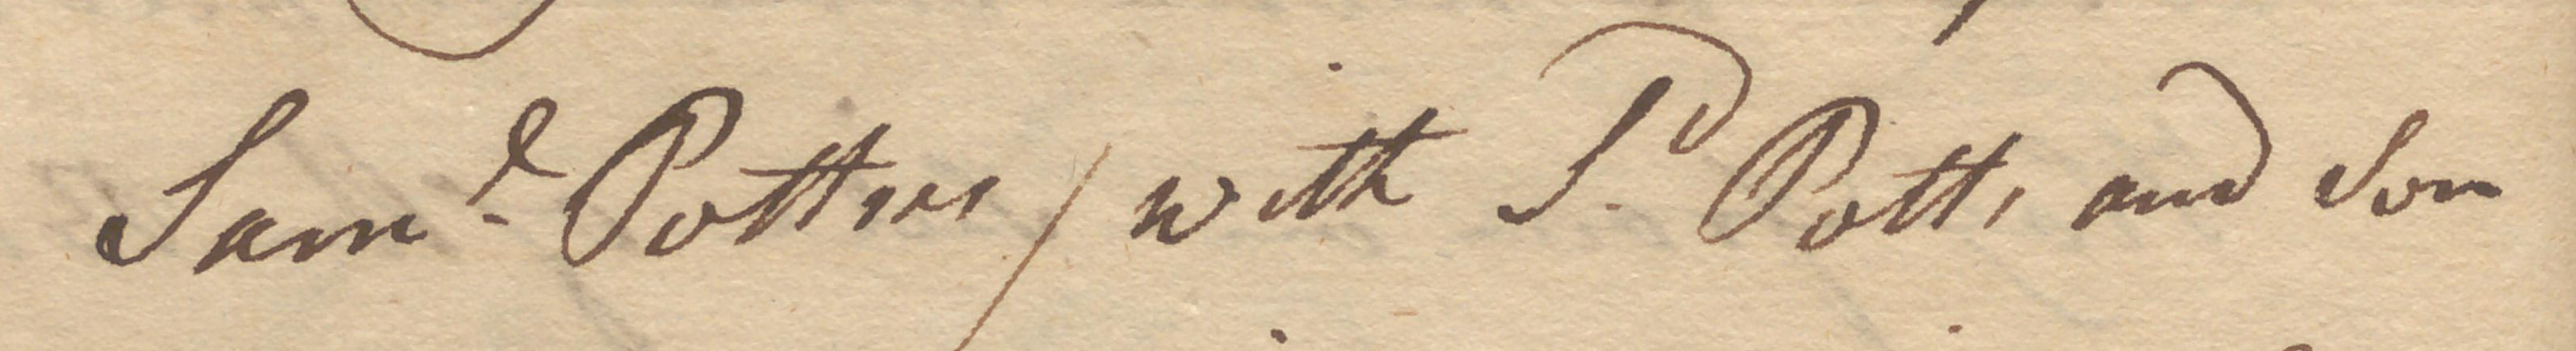Sam^l. Pottses with S^d. Potts and Son
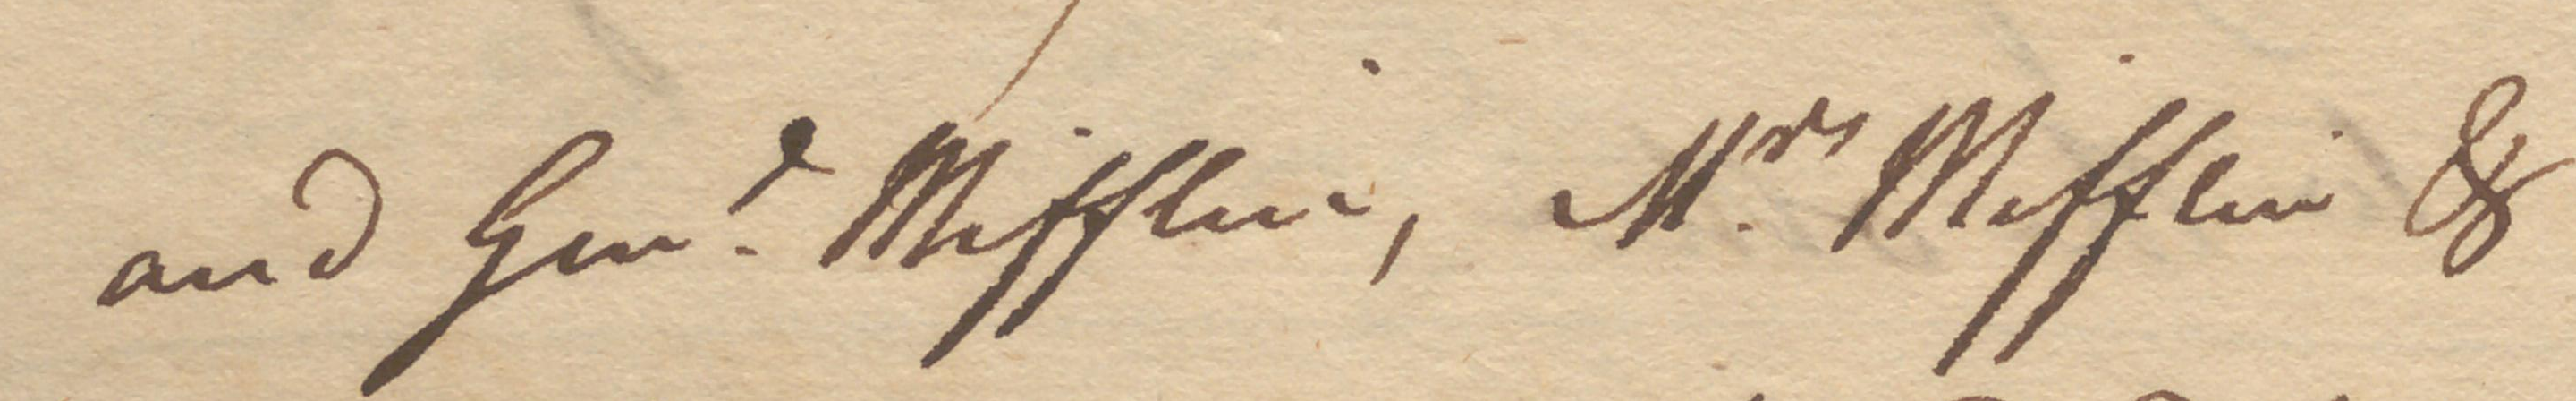and Gen^l. Mifflin, M^rs. Mifflin &
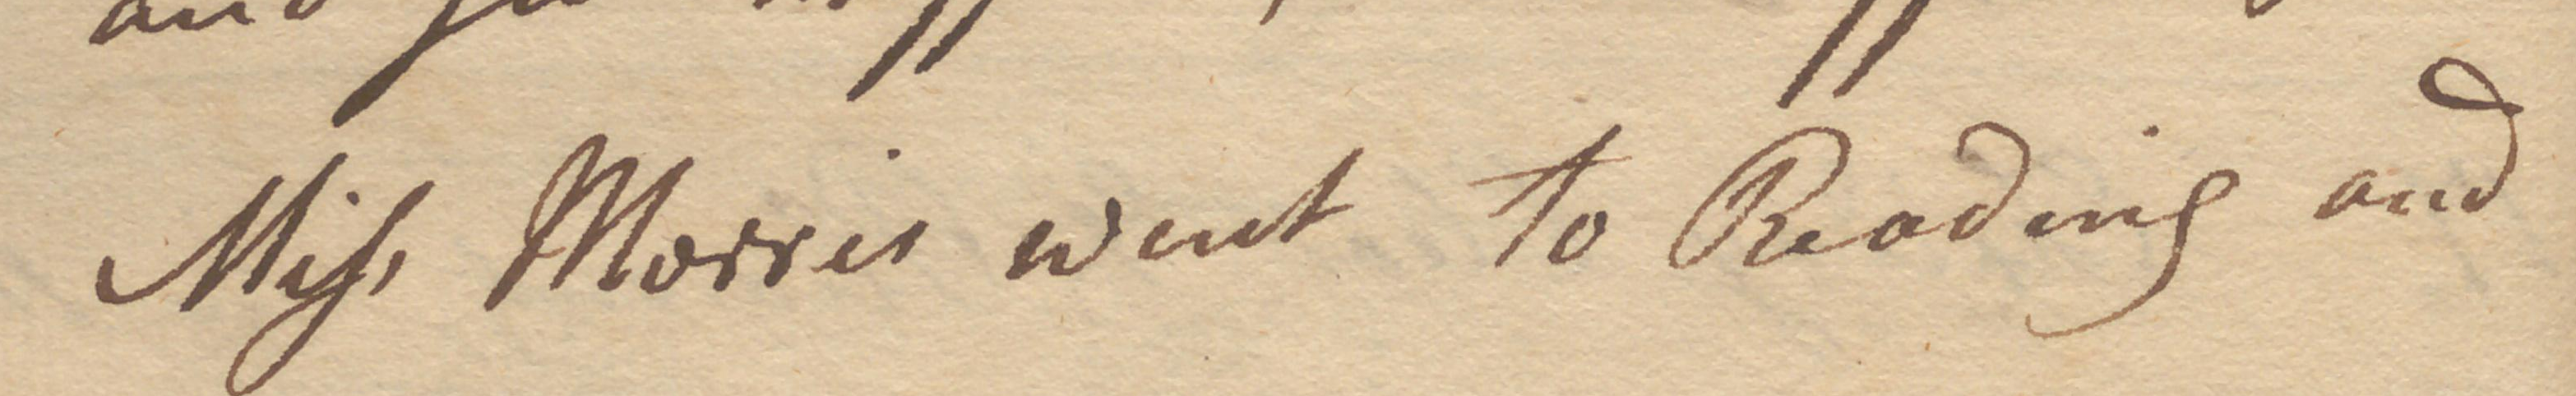Miss Morres went to Reading and
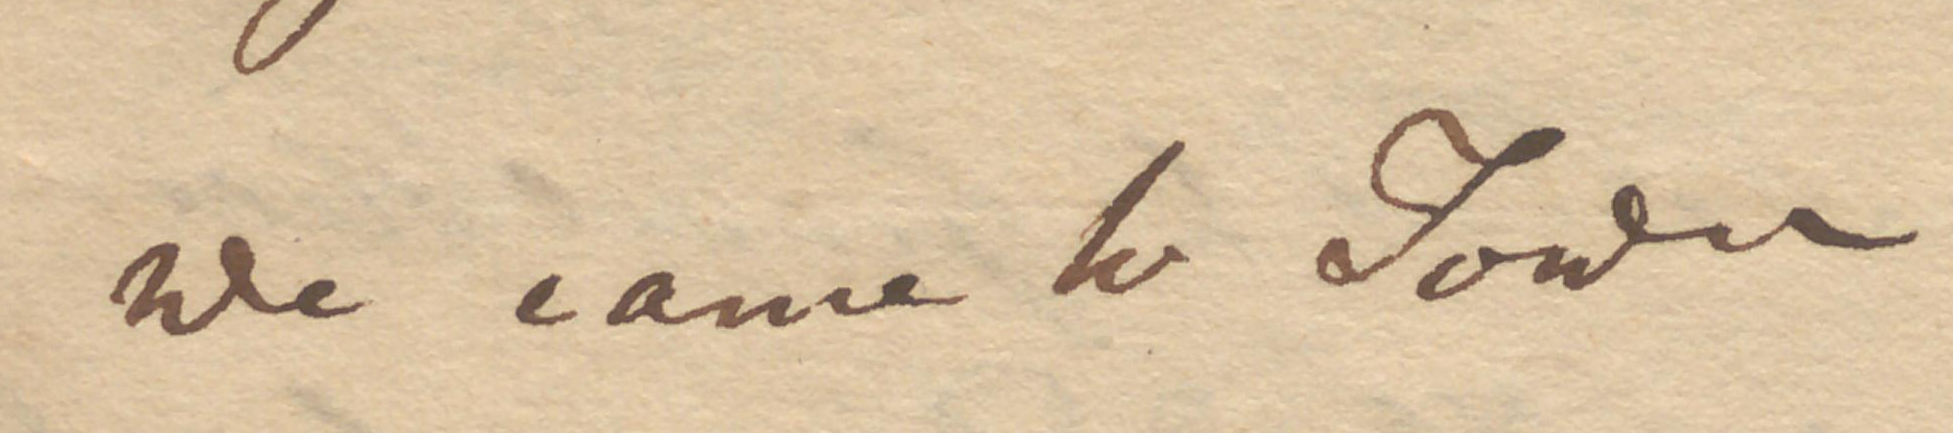we came to Town
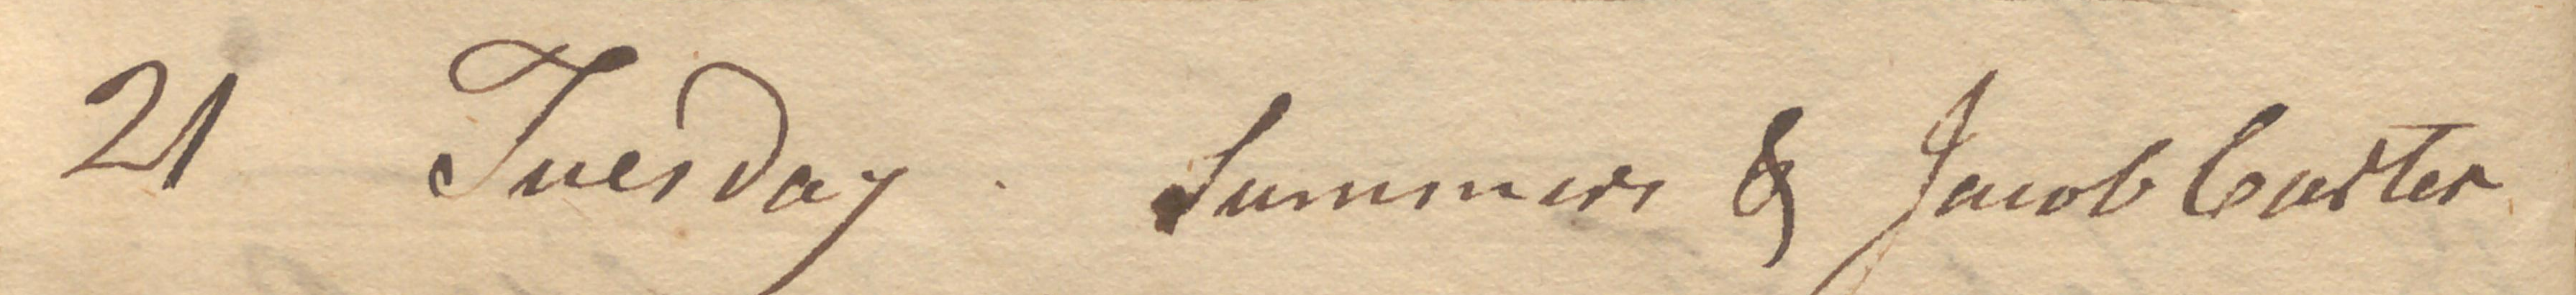21 Tuesday. Summers & Jacob Carter
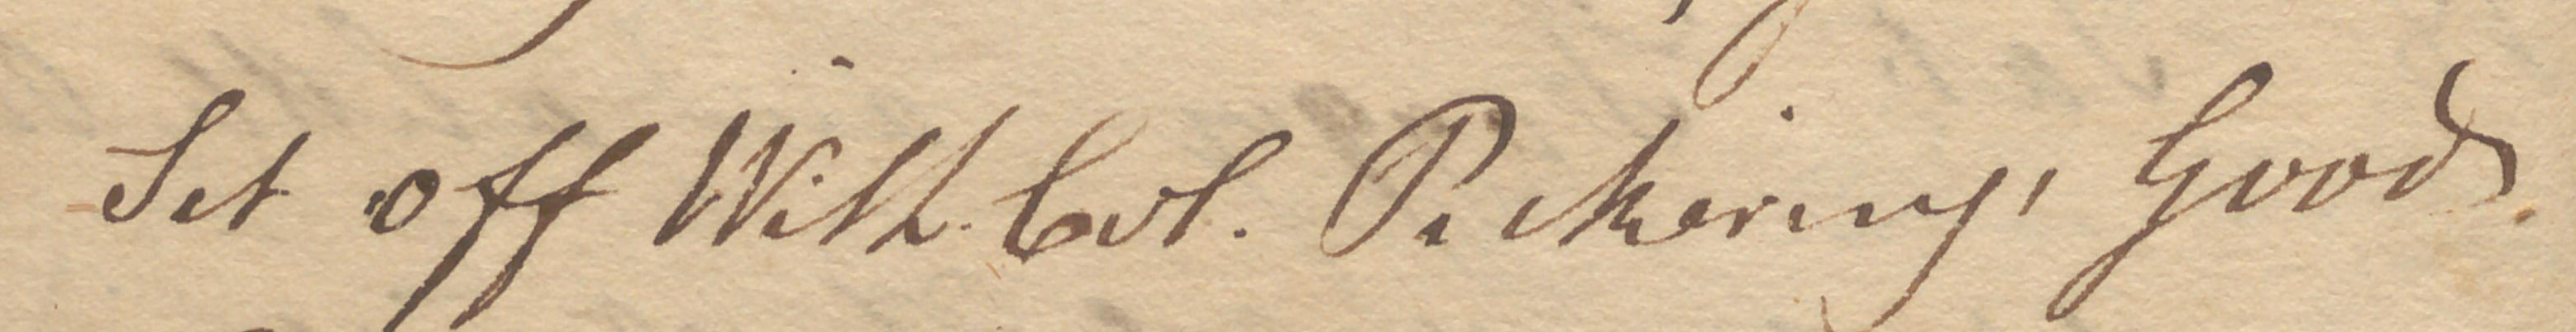Set off With Col. Pickerings Goods
